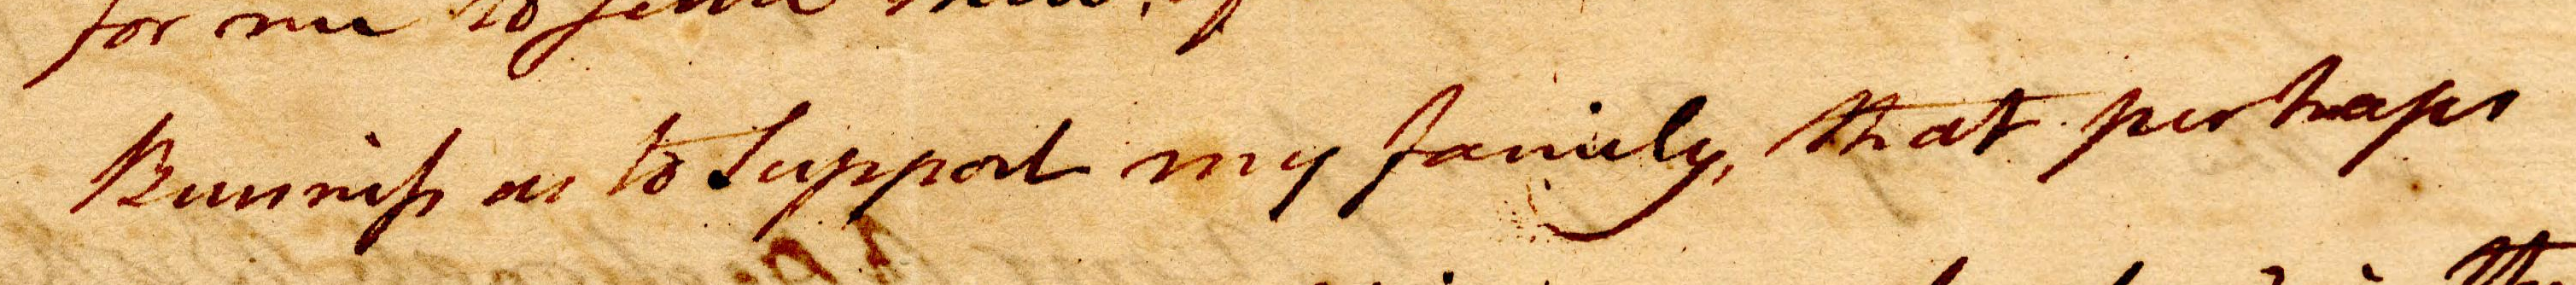Business as to Support my family, that perhaps
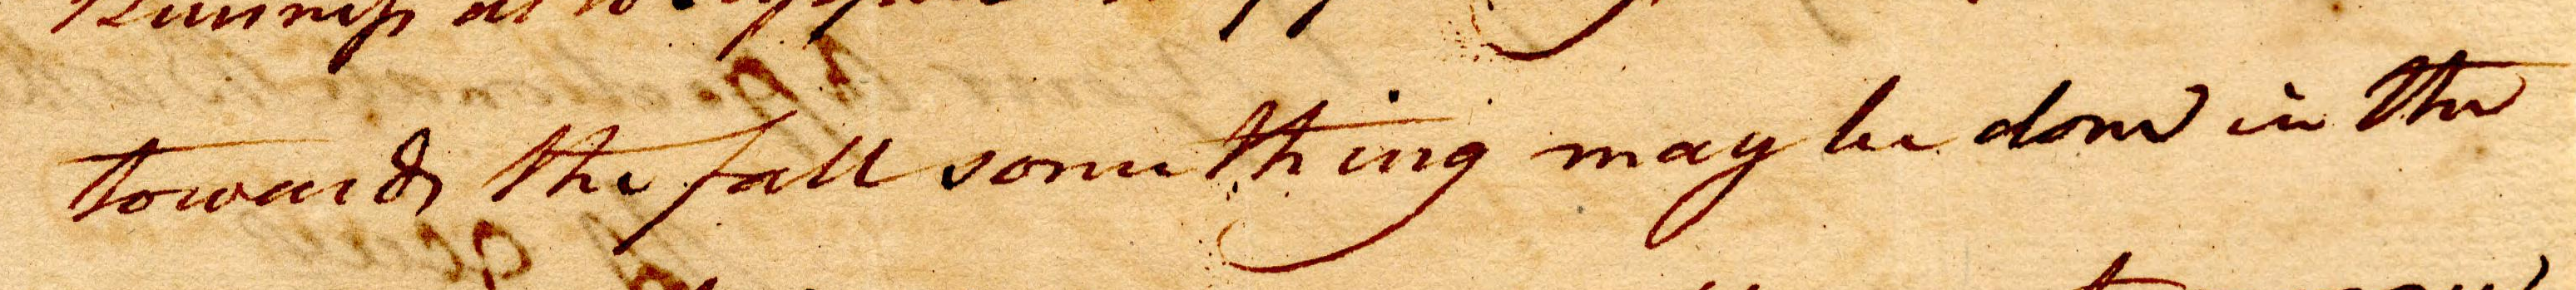towards the full something may be done in the
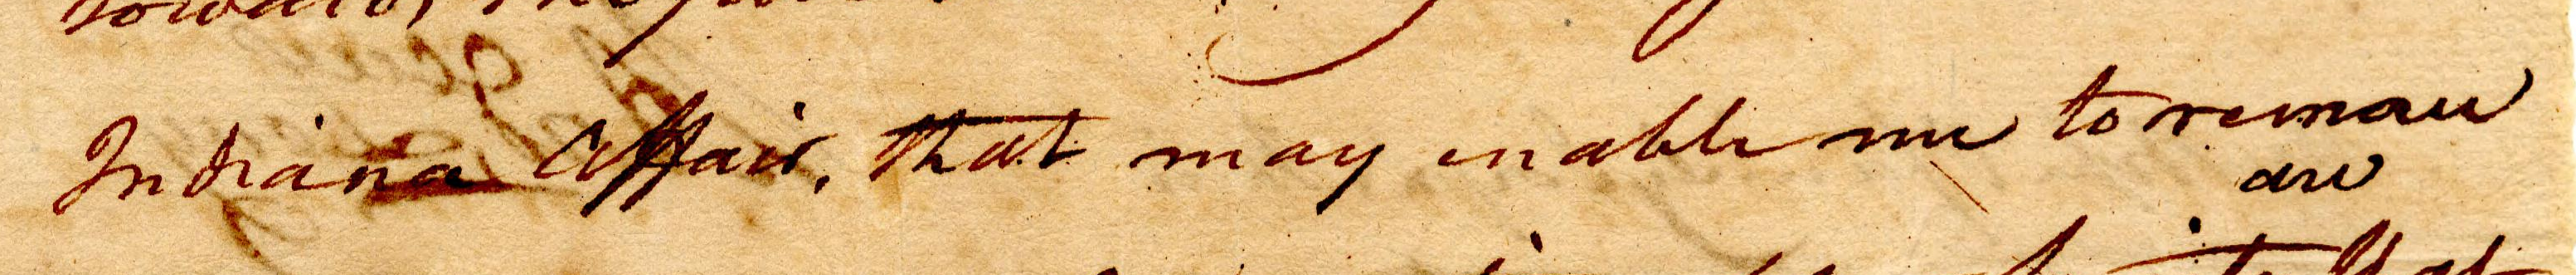Indiana Affair, that may enable me to remain
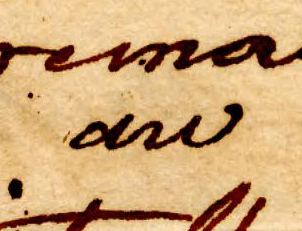are
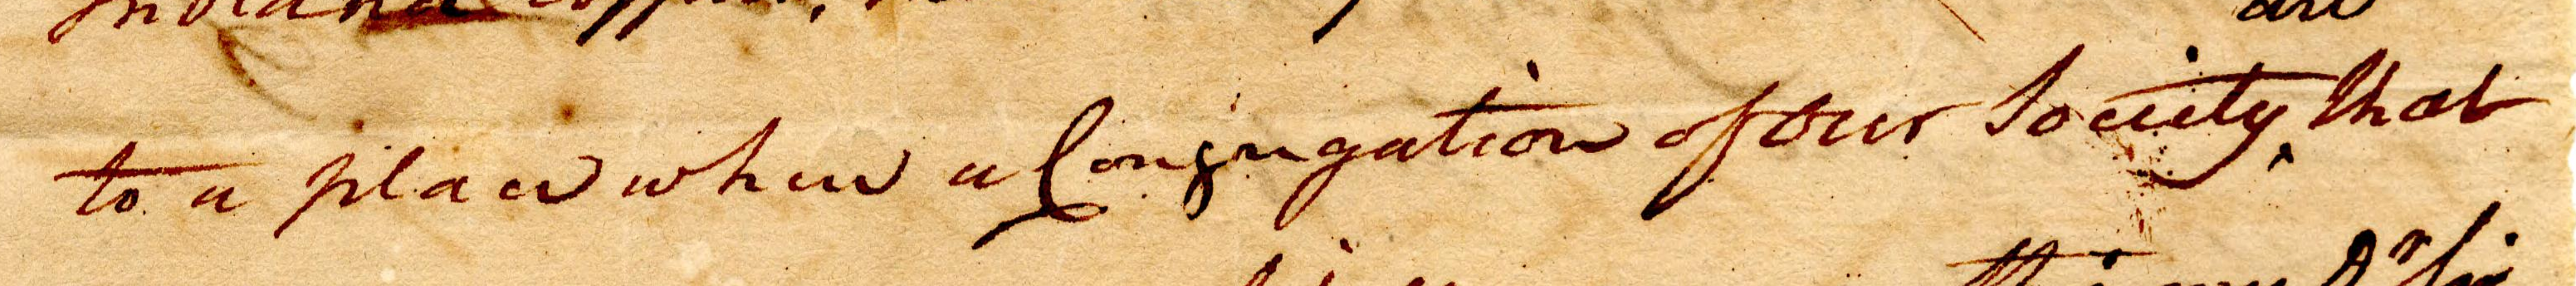to a place where a Congreagations of our Society ^ that
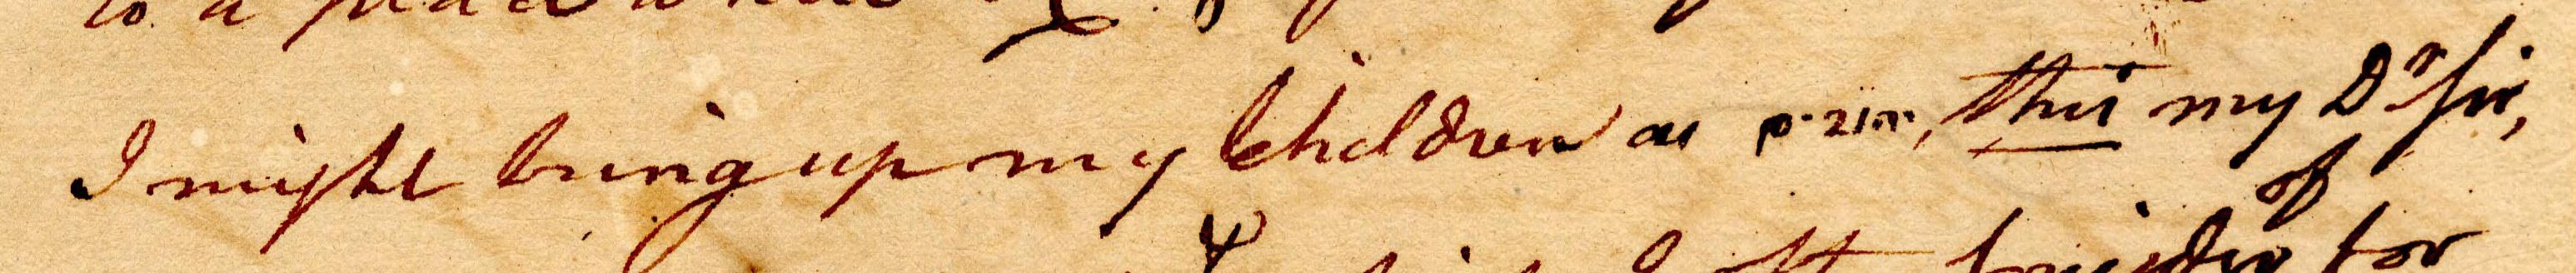I might bring up my Children as [___] this my D^r. Sir.,
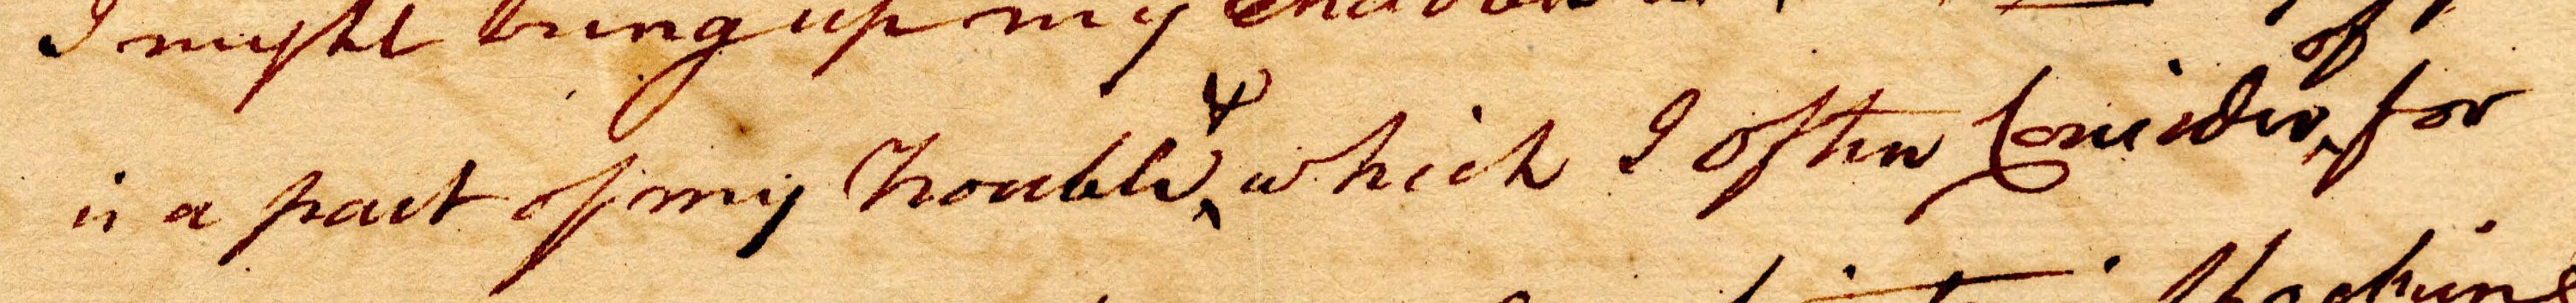is a part of my Troubles ^ which I often Consider ^ for
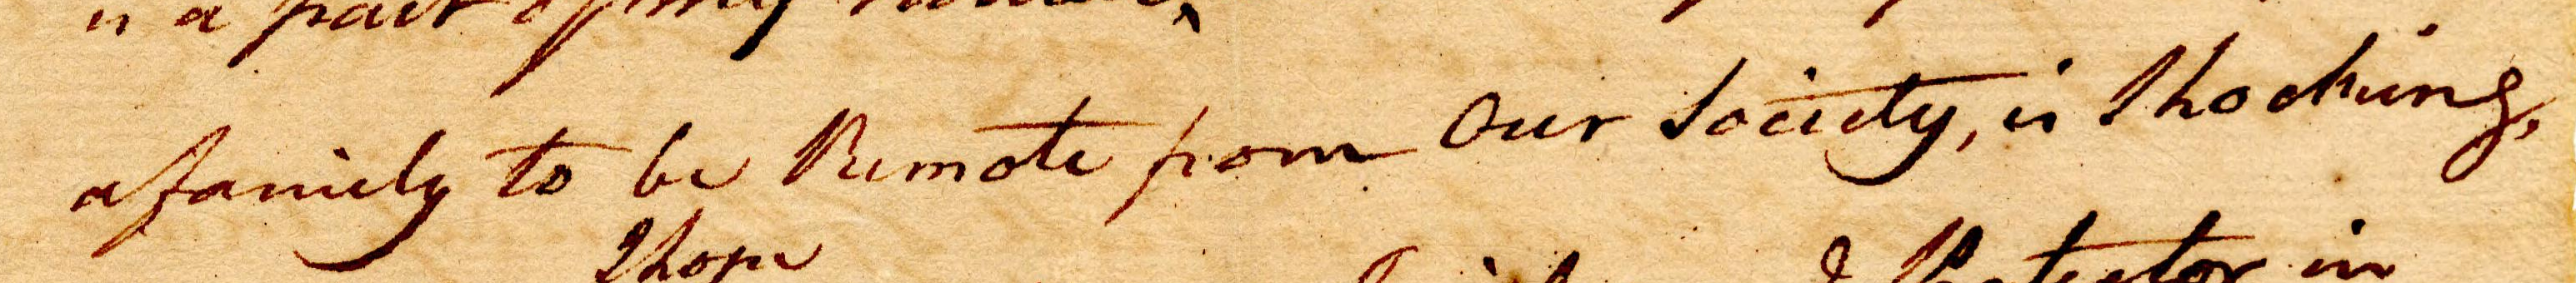a family to be Remote from our Society, is shocking
